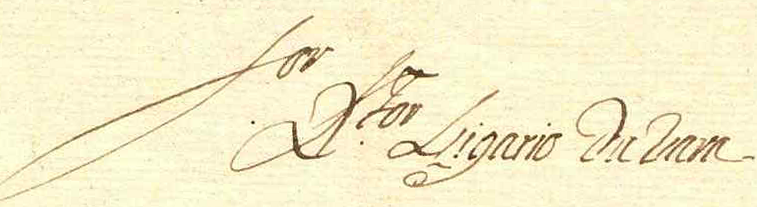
S.or D.tor Vigario da Vara
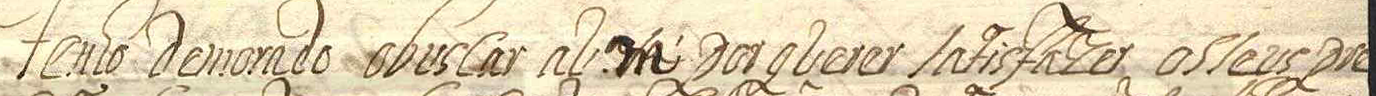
Tenho demorado o busCar a V.m por querer satisfazer os seus pre
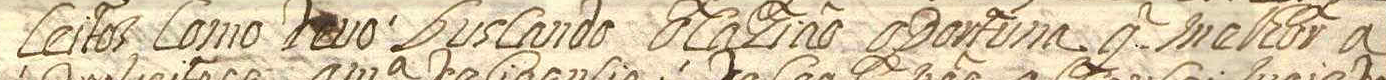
Ceitos Como devo busCando ocaziaõ oportuna q̄ melhor a
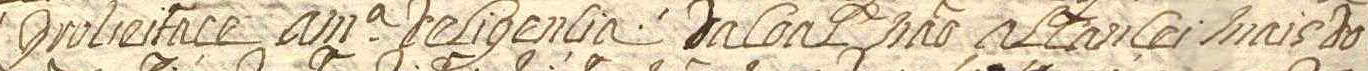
proveitace a m.a deligencia da Coal naõ alCanCei mais do
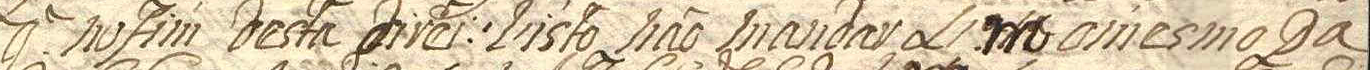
q̄ no fim desta direi: visto naõ mandar Livro o mesmo pa
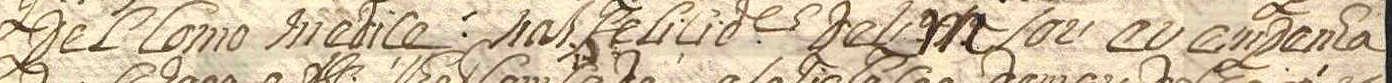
pel Como me dice; nas Felicid.es de Vm sou eu empenha
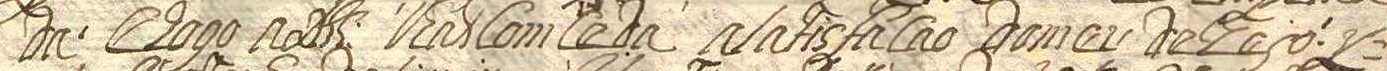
da E logo a Ds. lhas ComCeda a satisfaçaõ do meu deZejo y
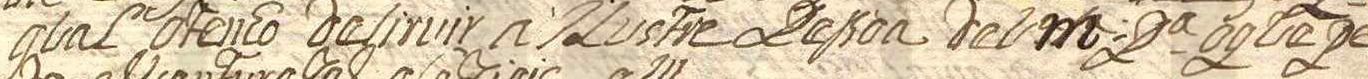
gual o tenho de siruir a ILustre Pessoa de Vm. pa o que pe
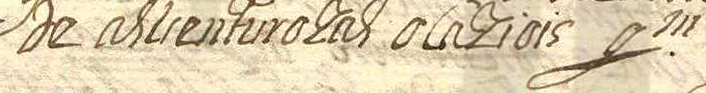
de aventurozas oCaziois q.m
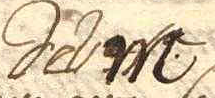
de V.m
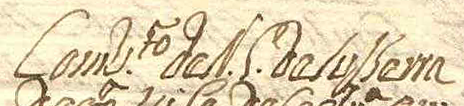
Comv.to de N. S. da Subserra
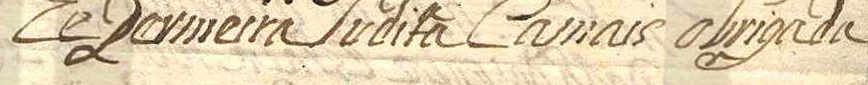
he permeira sudita E a mais obrigada
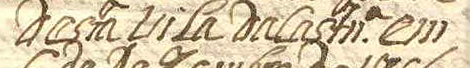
De snra vila da Castr.a em
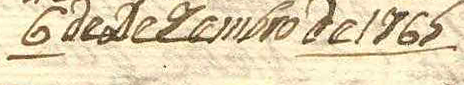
6 de Dezembro de 1765
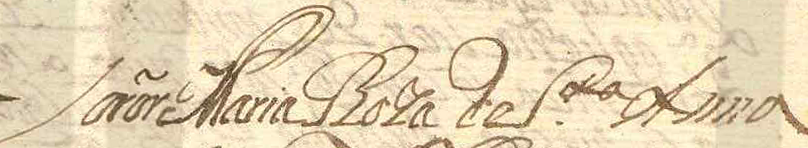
Soror Maria Roza de S.ta Anna
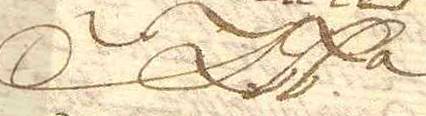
Abb.a
